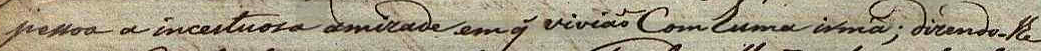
pessoa a incestuoza amizade em q̄ viviaõ com huma irmã; dizendo-lhe
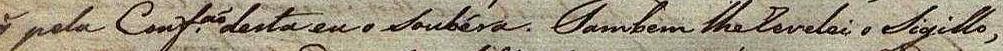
q̄ pela Conf.aõ desta eu o soubéra. Tambem lhe revelei o sigillo,
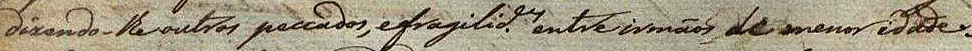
dizendo-lhe outros peccados, e fragilid.es entre irmaõs de menor idade.
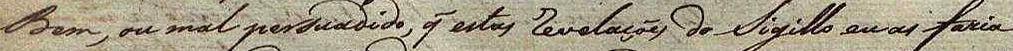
Bem, ou mal persuadido, q̄ estas revelações do Sigillo eu as fazia
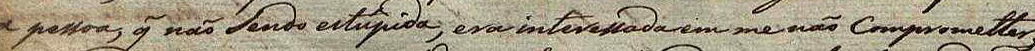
a pessoa, q̄ naõ sendo estúpida, era interessada em me naõ comprometter,
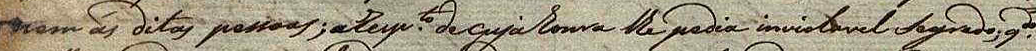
nem as ditas pessoas; a resp.to de cuja honra lhe pedia inviolavel segredo; q.do
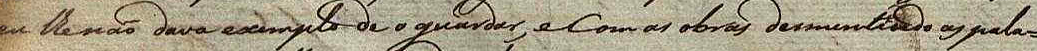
eu lhe naõ dava exemplo de o guardar, e com as obras desementindo as pala
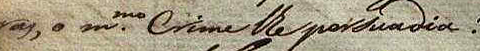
vras, o m.mo crime lhe persuadia!
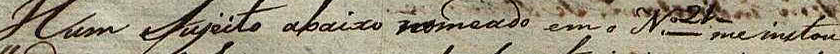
Hum sujeito abaixo nomeado em o Nº 21 me instou
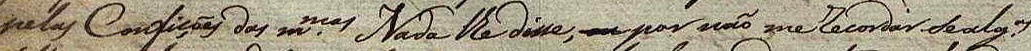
pelas Confições das m.mas Nada lhe disse, _ por naõ me recordar se alg.as
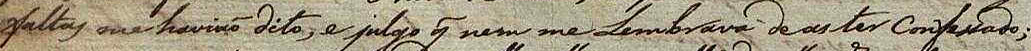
faltas me haviaõ dito, e julgo q̄ nem me lembrava de as ter confessado;
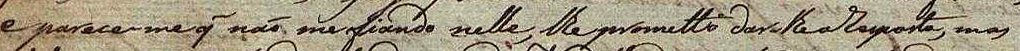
e parece-me q̄ naõ me fiando nelle, lhe prometti dar-lhe a Resposta, mas
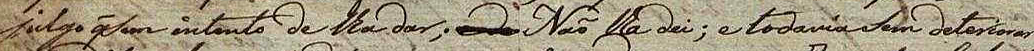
julgo q̄ sem intento de lha dar; _ Naõ lha dei; e todavia sem deteriorar
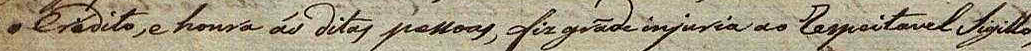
o credito, e honra ás ditas pessoas, fiz grāde injuria ao Respeitavel Sigillo,
